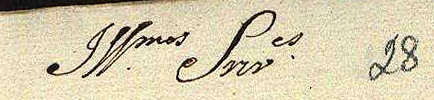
Ill.mos Snr.es 28
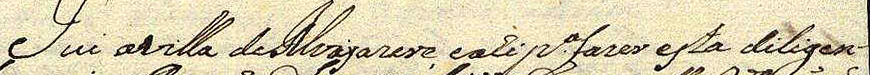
Fui a villa de Alvayazere, e ahi p.a fazer esta diligen
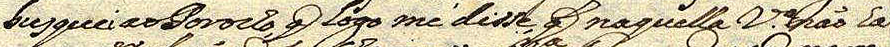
busquei ao Parocho, q̄ Logo me disse, q̄ naquella V.a naõ ha
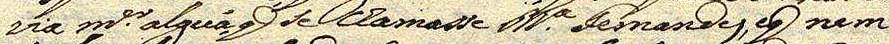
via m.er alguā q̄ se chamasse M.a Fernandes, e q̄ nem
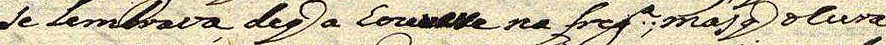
se lembrava de q̄ a houuese na freg.a; mas q̄ o cura
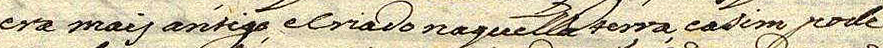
era mais antigo, e criado naquella terra, e asim pode
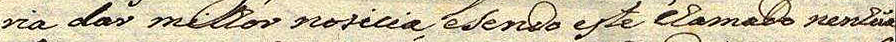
ria dar milhor noticia, e sendo este chamado nenhuā
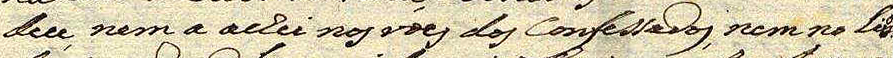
dece, nem a achei nos roes dos Confessados, nem no Liv.o
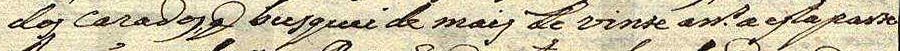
dos cazados, q̄ busquei de mais de vinte an.s a esta parte
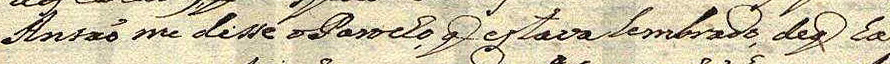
Antão me disse o Parocho, q̄ estava lembrado, de q̄ ha
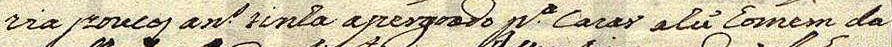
via poucos an.s tinha apergoado p.a cazar a hū homem da
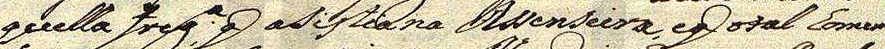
quella freg.a q̄ asistia na Assenseira, e q̄ o tal homem
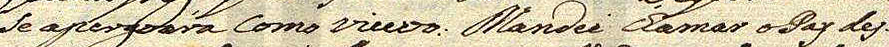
se apergoára como viuvo. Mandei chamar o Pay des
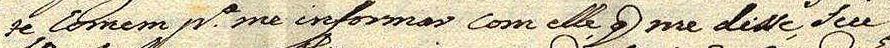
te homem p.a me informar com elle, q̄ me disse, seu
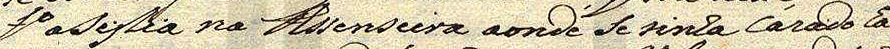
f.o asistia na Assenseira aonde se tinha cazado ha
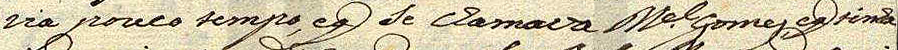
via pouco tempo, e q̄ se chamava M.el Gomes, e q̄ tinha
